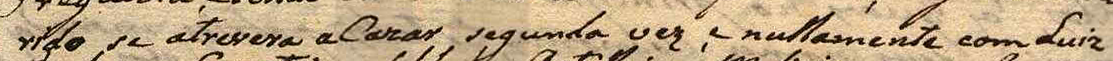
rido se atrevera a Cazar segunda vez, e nullamente com Luiz
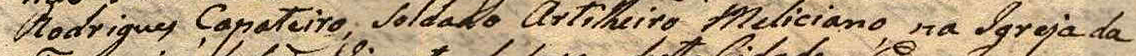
Rodrigues Çapateiro, soldado Artilheiro Meliciano, na Igreja da
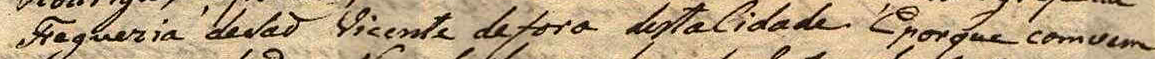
Freguezia de Saõ Vicente de fora desta Cidade. E porque comvem
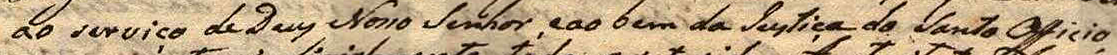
ao serviço de Deus Nosso Senhor, e ao bem da Iustiça do Santo Officio,
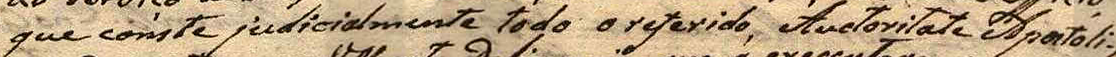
que conste judicialmente todo o referido, Auctoritate Apostoli
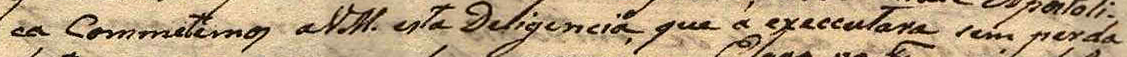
ca Commetemos a VM. esta Deligencia, que á execcutara sem perda
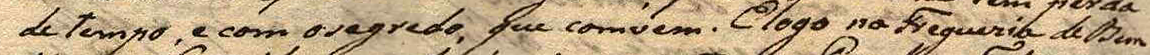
de tempo, e com o segredo, que comvem. E logo na Freguezia de Bem
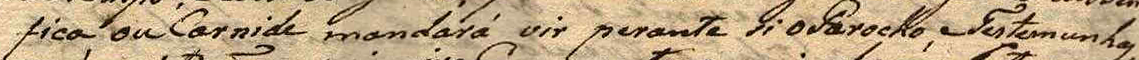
fica, ou Carnide mandárá vir perante si o Parocho, e Testemunhas
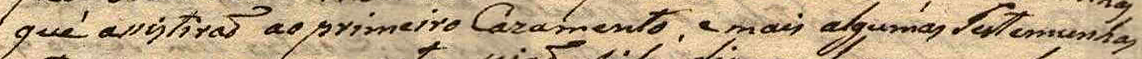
que assistiraõ ao primeiro Cazamento, e mais algumas Testemunhas
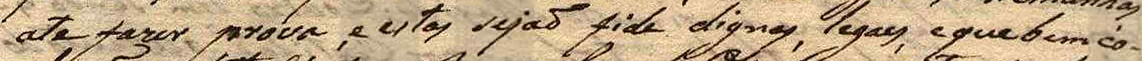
ate fazer prova, e estas sejaõ fidedignas, legaes, e que bem co
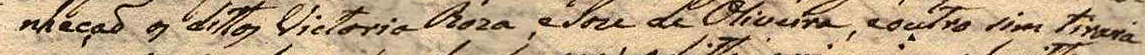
nhaçaõ os dittos Victoria Roza, e Ioze de Oliveira, e outrosim tirará
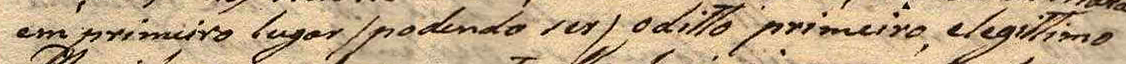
em primeiro lugar /podendo ser/ o ditto primeiro, e legittimo
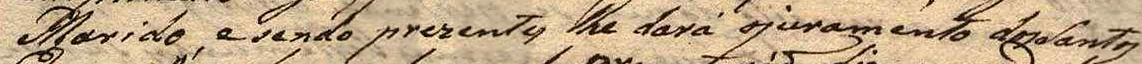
Marido, e sendo prezentes lhe dará o juramento dos Santos
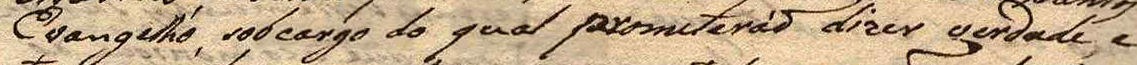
Evangelho, sobcargo do qual prometeraõ dizer verdade, e
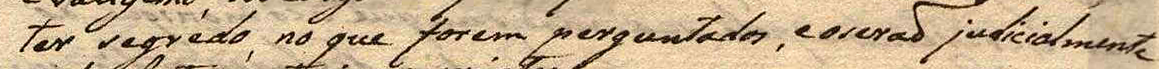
ter segredo no que forem perguntados, e o seraõ judicialmente
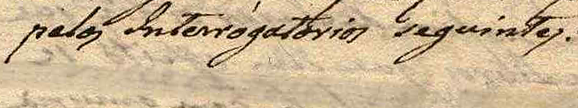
pelos Interrogatorios seguintes.
